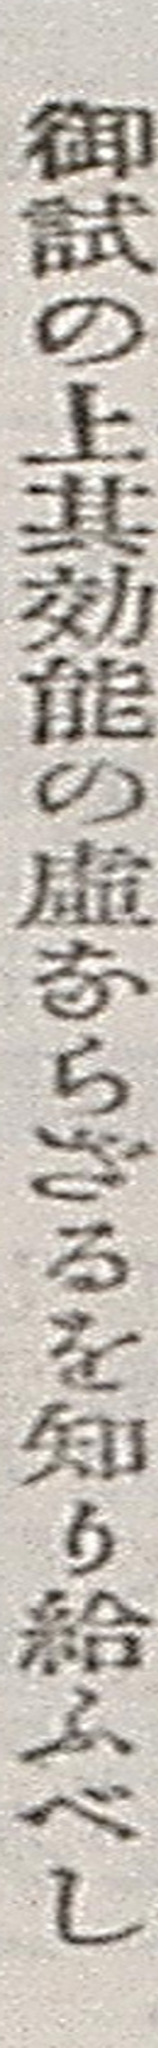御試の上其効能の虚ならざるを知り給ふべし
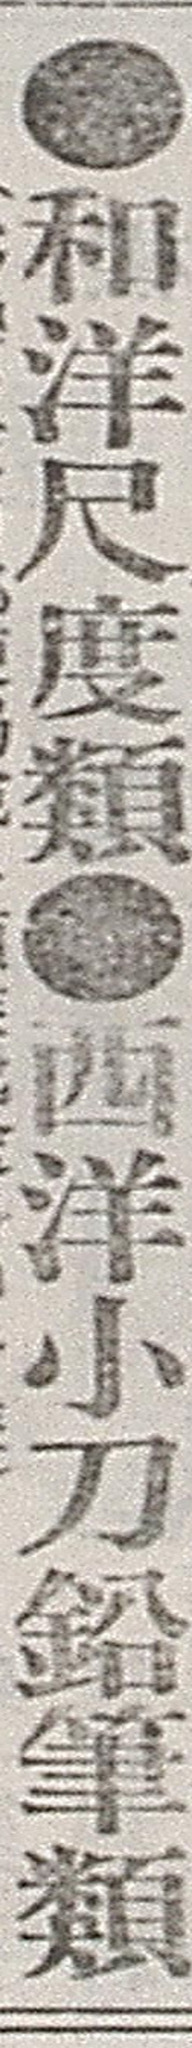●和洋尺度類●西洋小刀鉛筆類
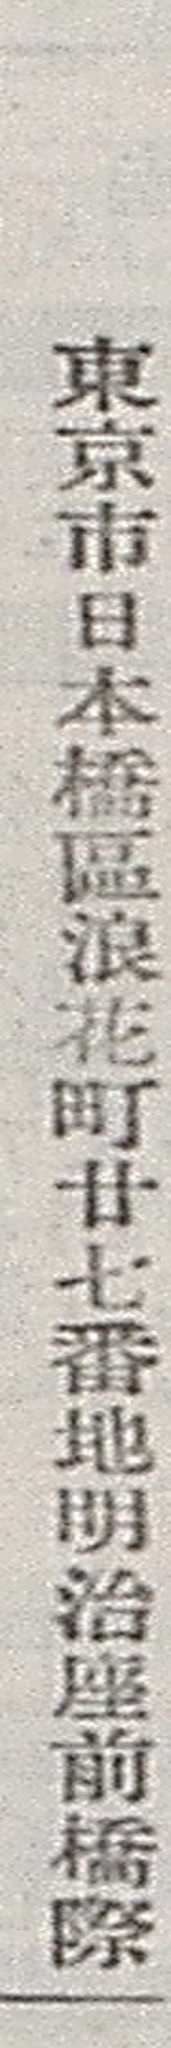東京市日本橋区浪花町廿七番地明治座前橋際
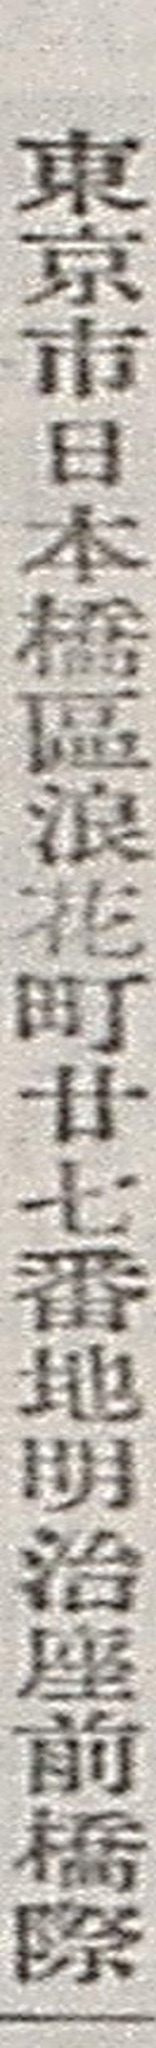東京市日本橋区浪花町廿七番地明治座前橋際
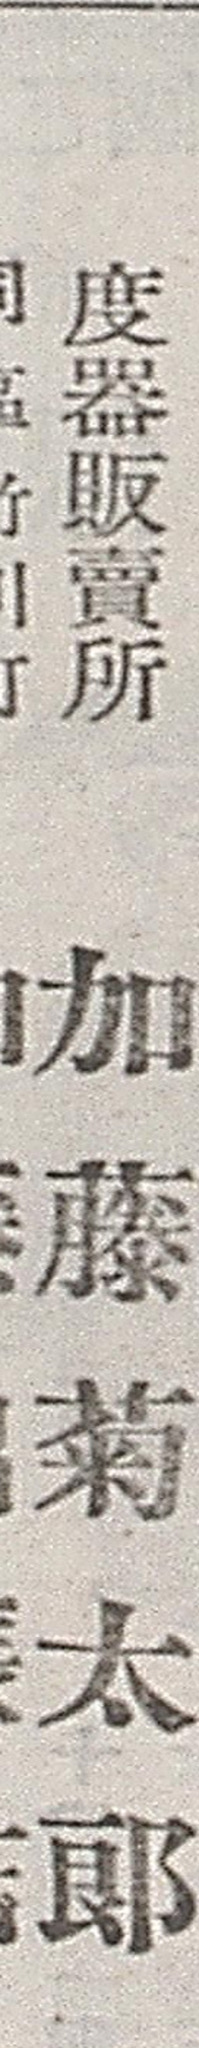度器販売所加藤菊太郎
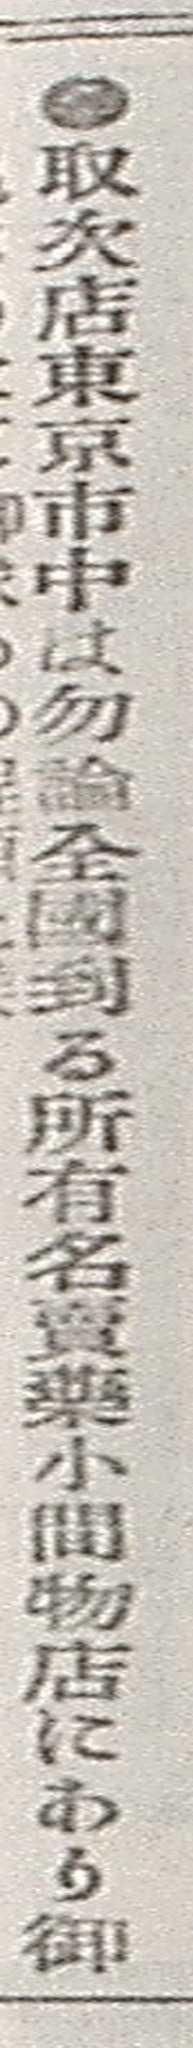●取次店東京市中は勿論全国到る所有名売薬小間物店にあり御
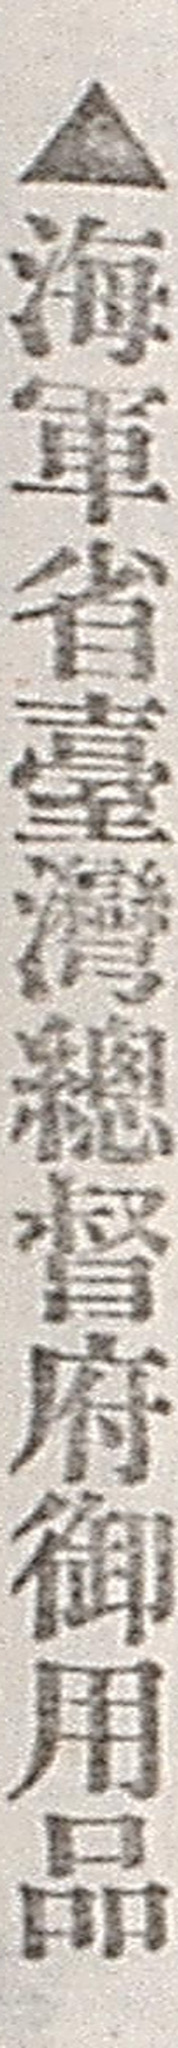▲海軍省台湾総督府御用品
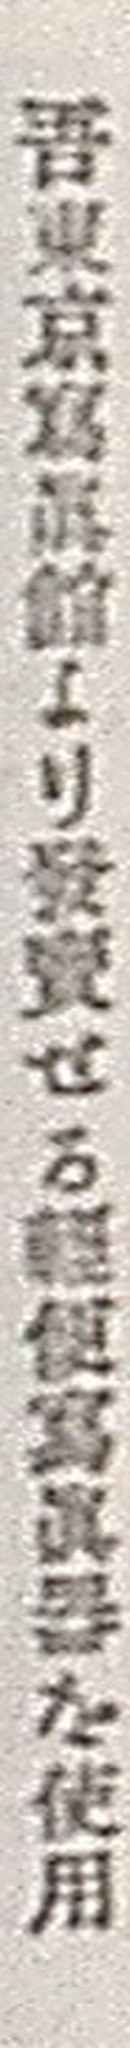吾東京写真館より発売せる軽便写真器を使用
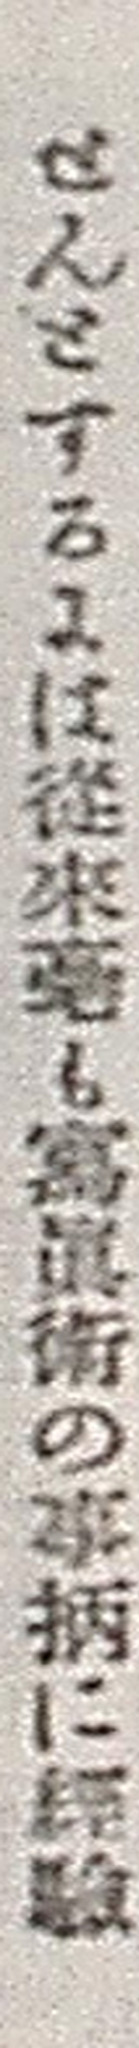せんとするには従来毫も写真術の事柄に経験
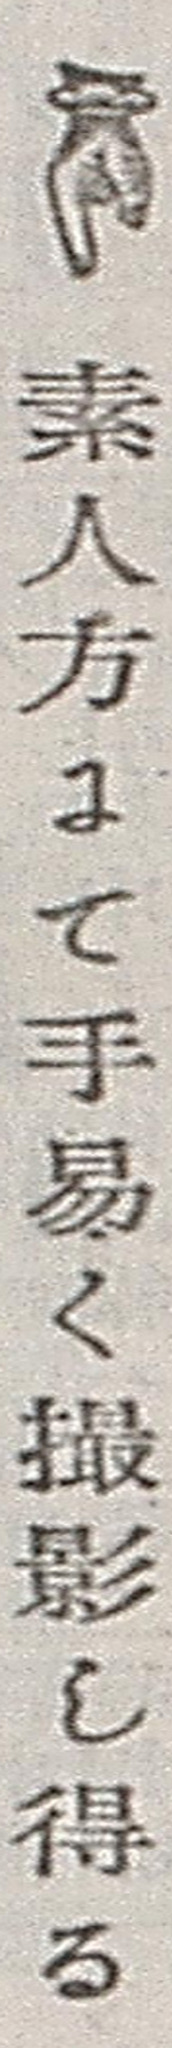素人方にて手易く撮影し得る
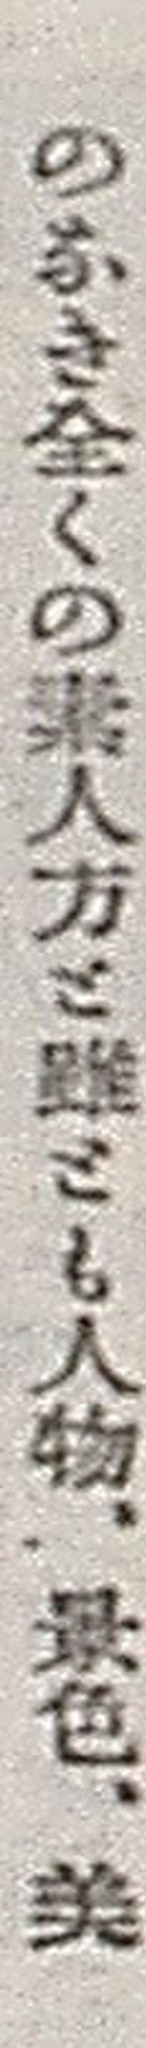のなき全くの素人方と雖とも人物、景色、美
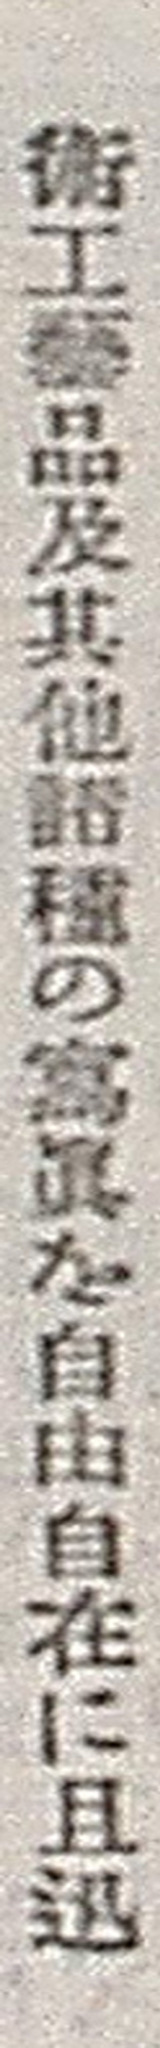術工芸品及其他諸種の写真を自由自在に且迅
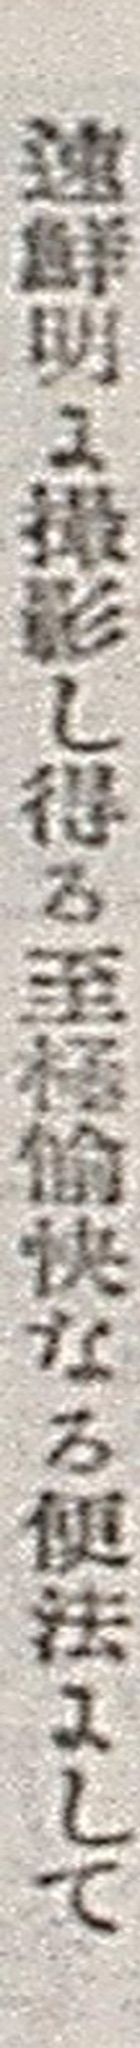速鮮明に撮影し得る至極愉快なる便法にして
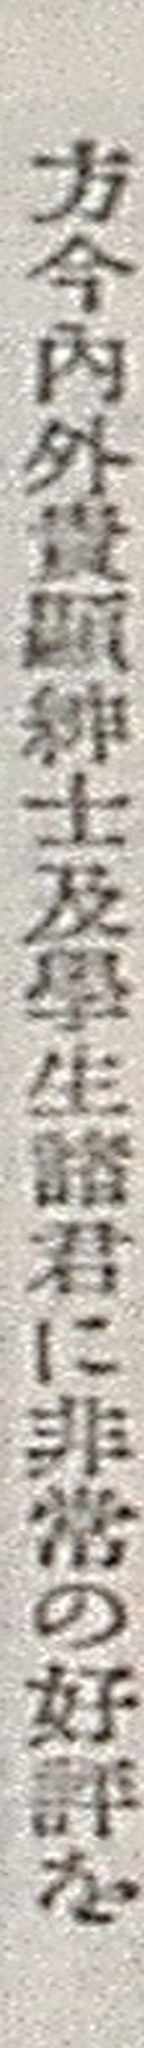方今内外貴顕紳士及学生諸君に非常の好評を
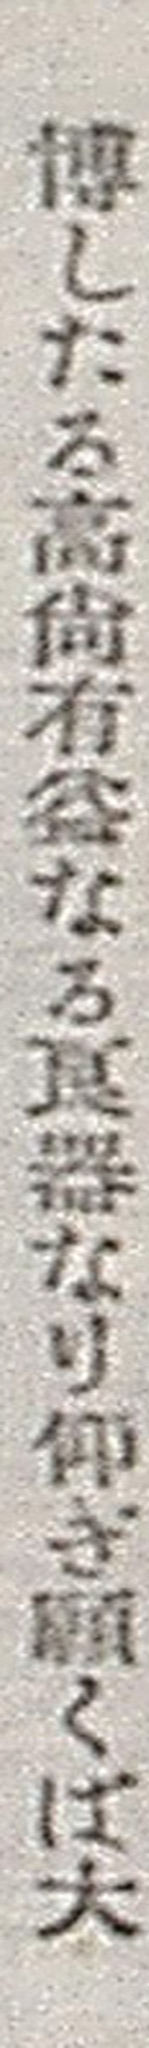博したる高尚有益なる良器なり仰ぎ願くば大
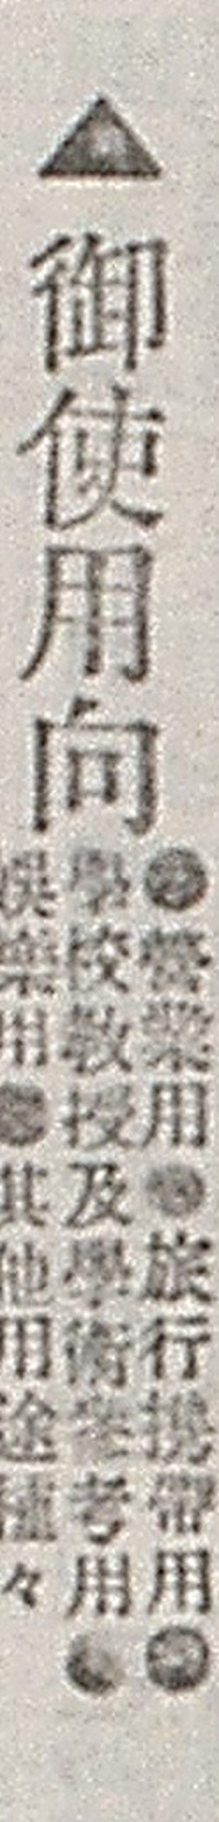▲御使用向学校教授及学術参考用●
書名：風俗畫報臨時増刊第百二十號　大海嘯被害録（下）
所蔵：東京大学地震研究所図書室 Earthquake Research Institute Library, The University of Tokyo, JAPAN
